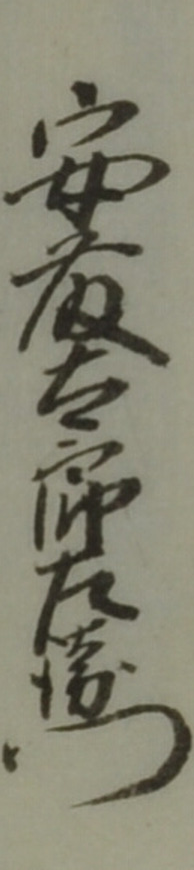安藤太郎左衛門
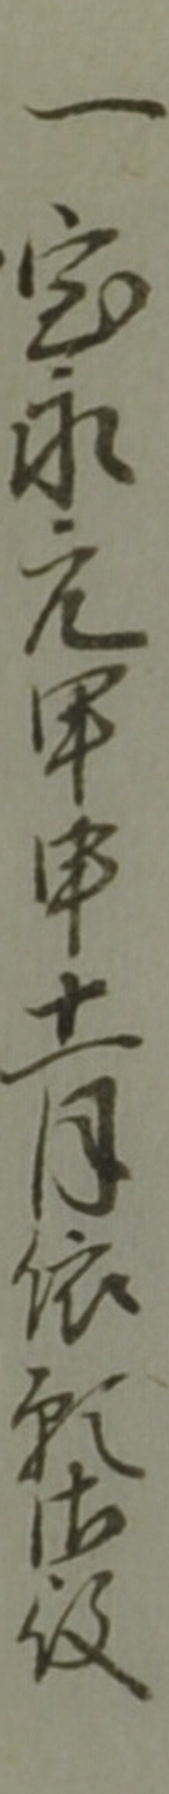一宝永元甲申十一月依頼御役
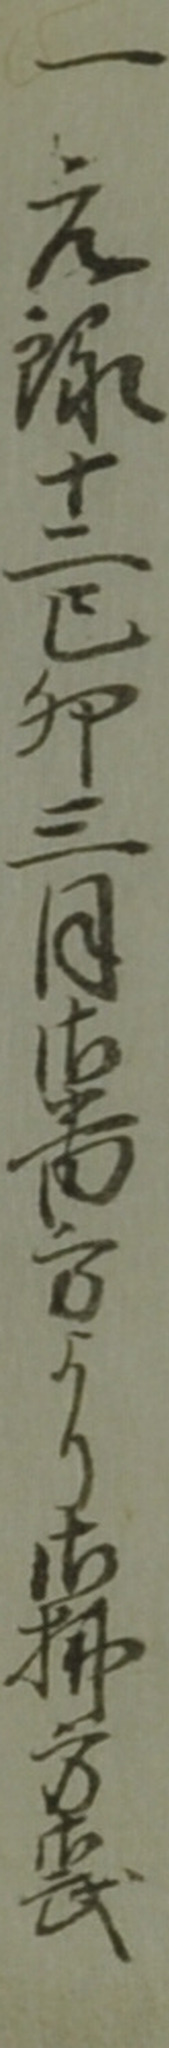一元禄十二己卯三月御番方より御払方御武
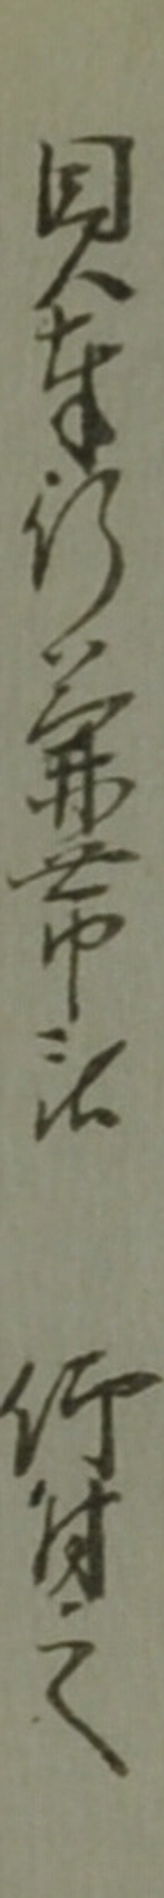具奉行兼帯被仰付之
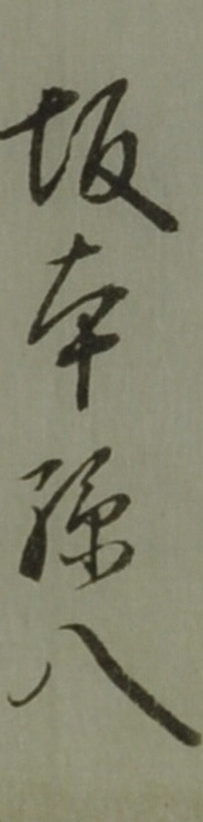坂本孫八
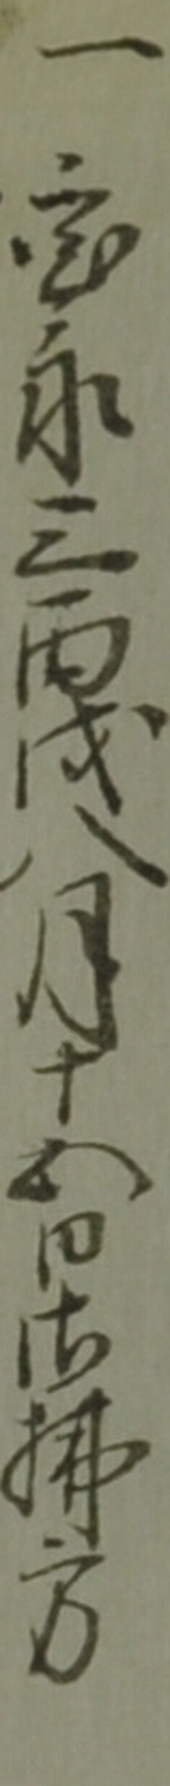一宝永三丙戌八月十五日御払方
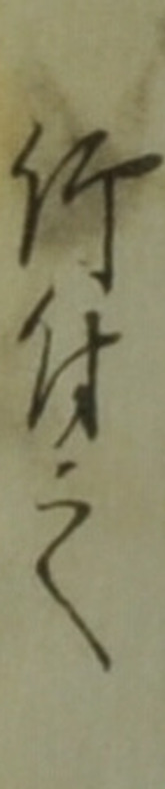仰付之
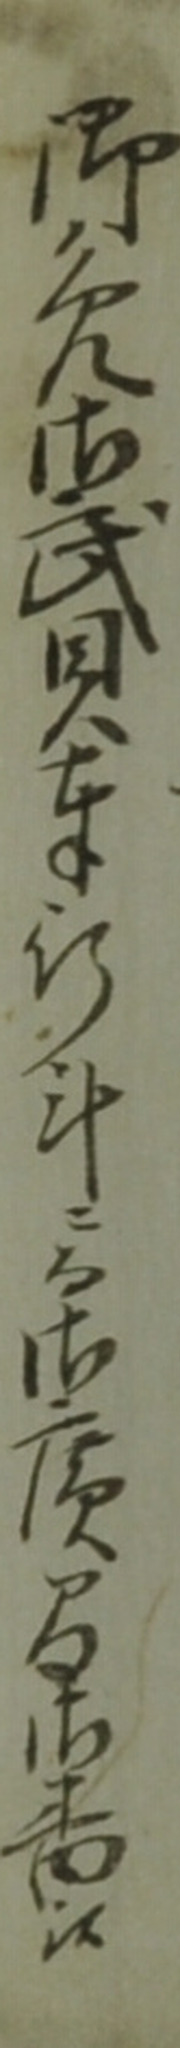御免御武具奉行斗ニ而御広間御番被

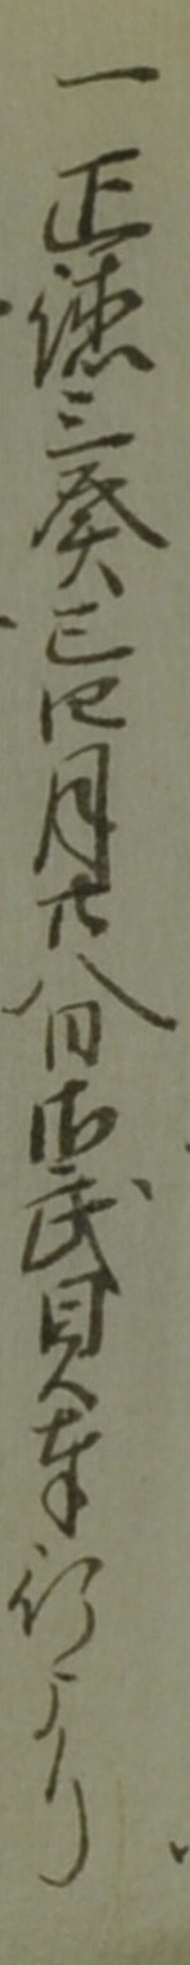一正徳三癸巳四月廿八日御武具奉行より
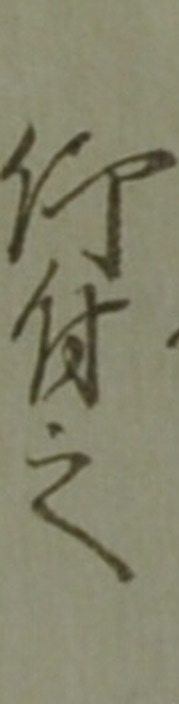仰付之
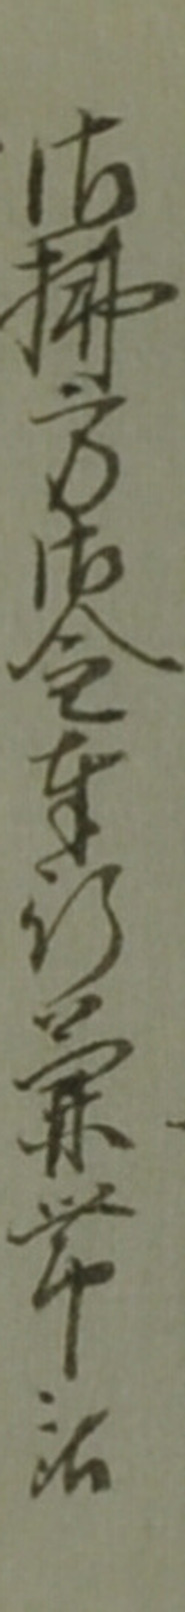御払方御金奉行兼帯被
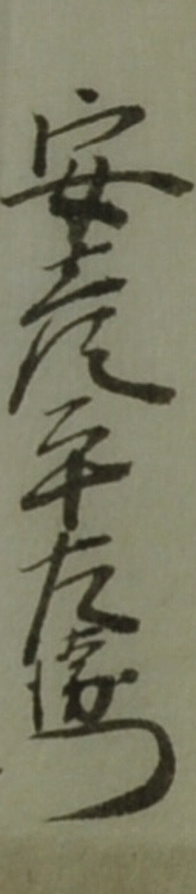安彦平左衛門
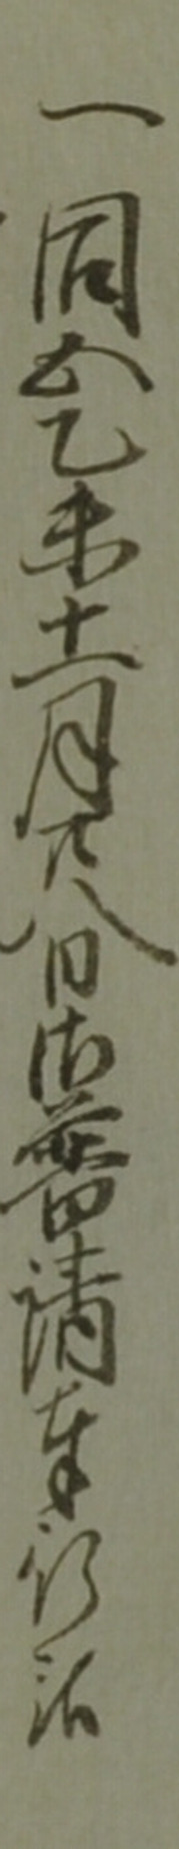一同五乙未十一月廿八日御普請奉行被
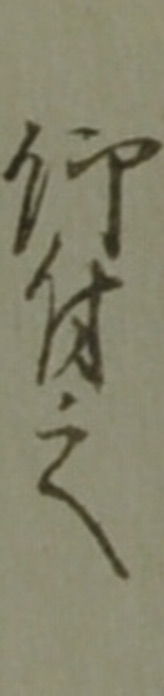仰付之
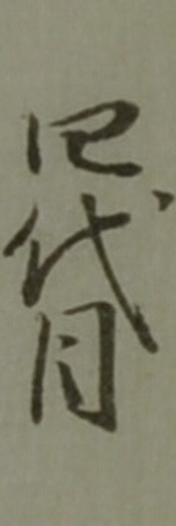四代目
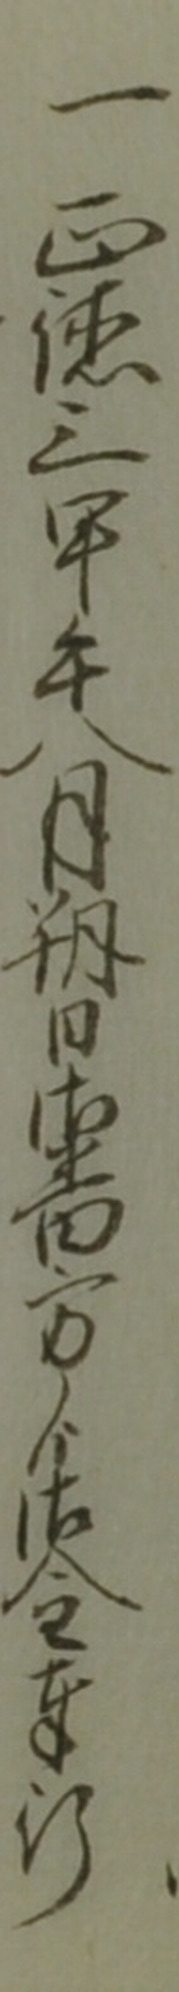一正徳三甲午八月朔日御番方より御金奉行
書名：諸御役代々録（八）
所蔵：伊那市立高遠町図書館・合同会社AMANE
